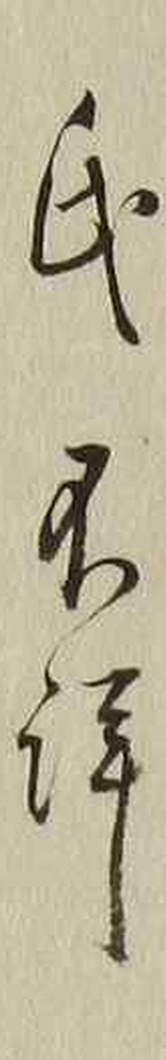氏不詳
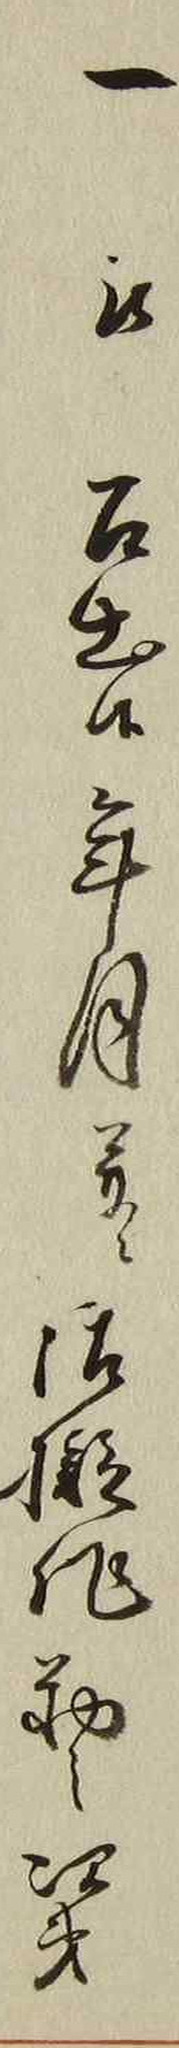一被召出候年月幷ニ御擬作勤之次第
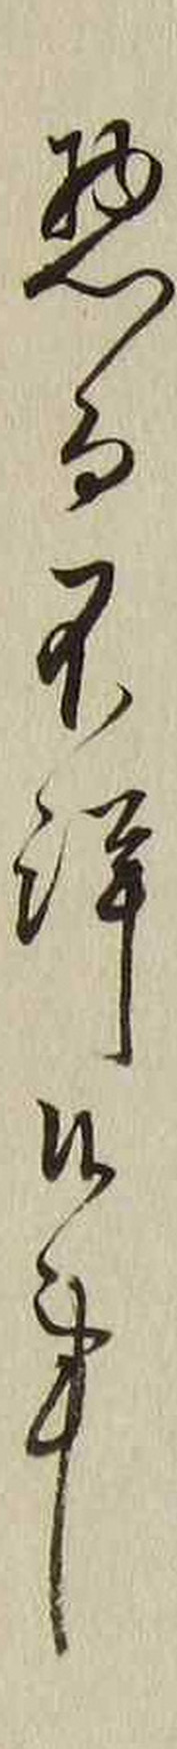惣而不詳候事
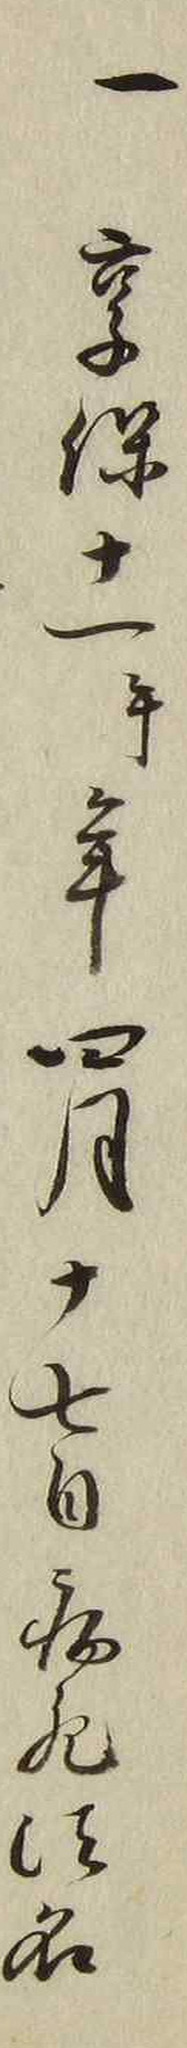一享保十一午年四月十七日病死法名
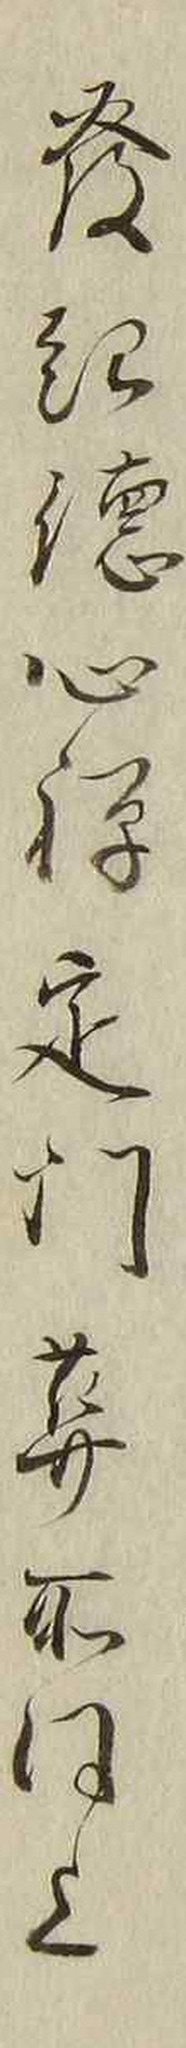発紀徳心禅定門葬所同上

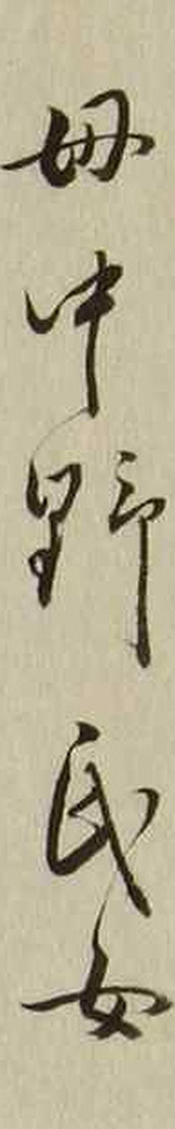母中野氏女
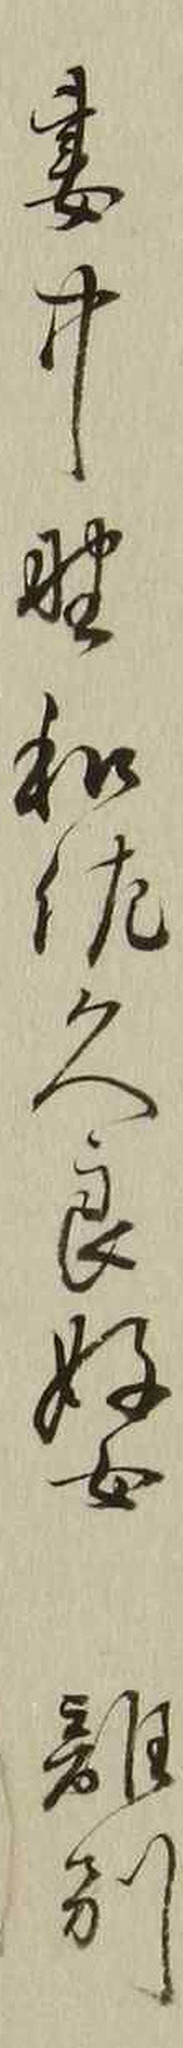妻中野和佐久良好女離別
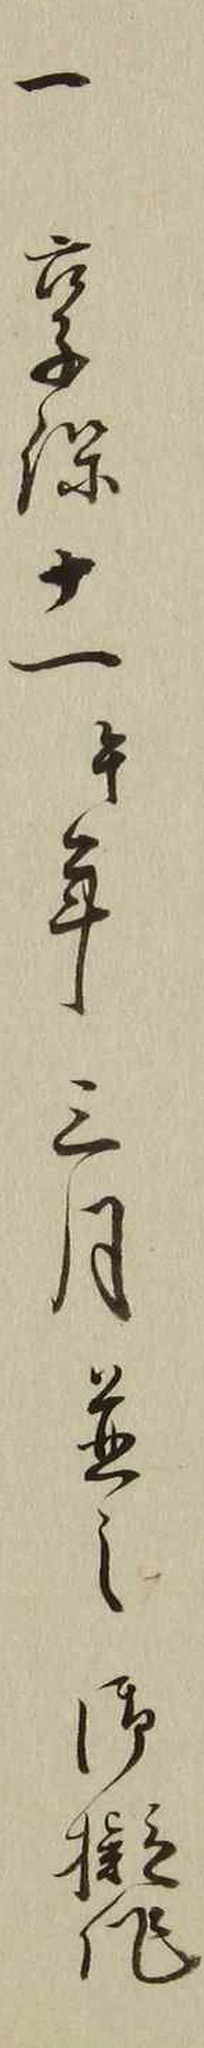一享保十一午年三月並之御擬作
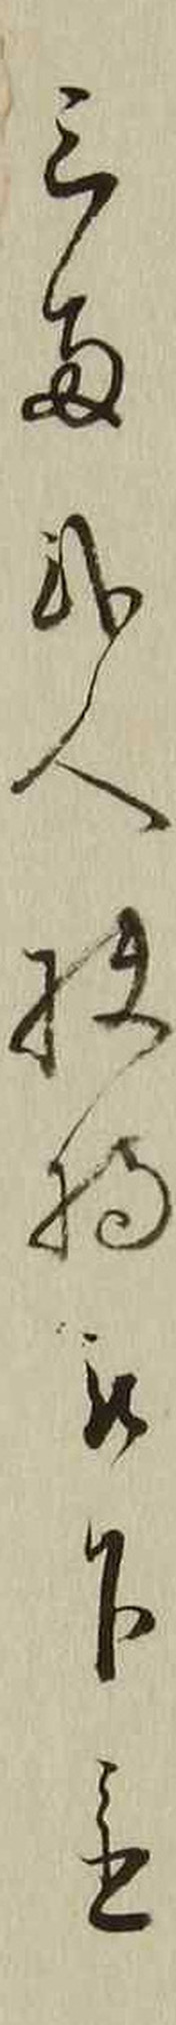三両弐人扶持被下置
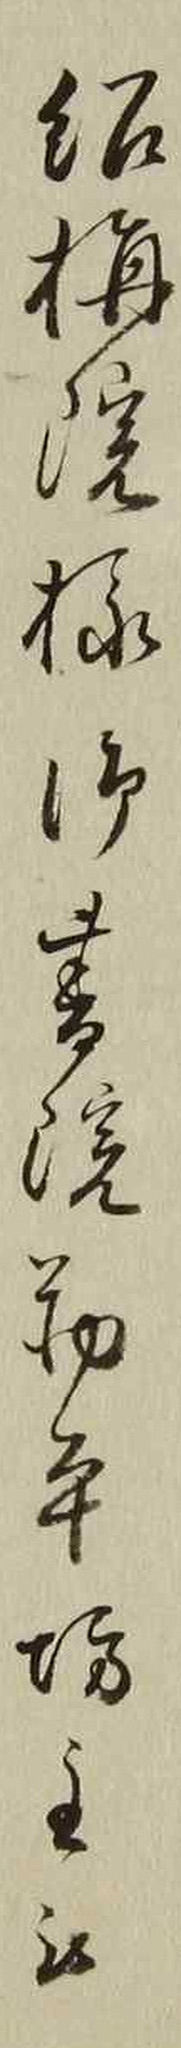紹栴院様御書院勤平坊主被
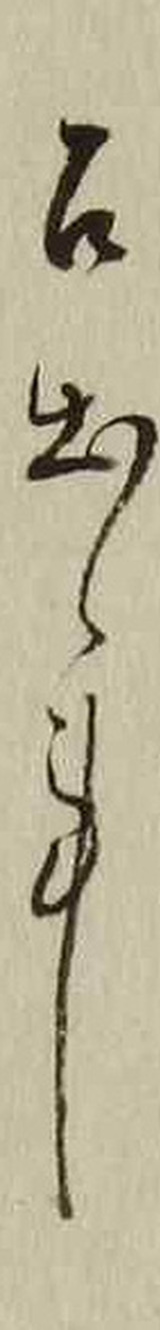召出候事
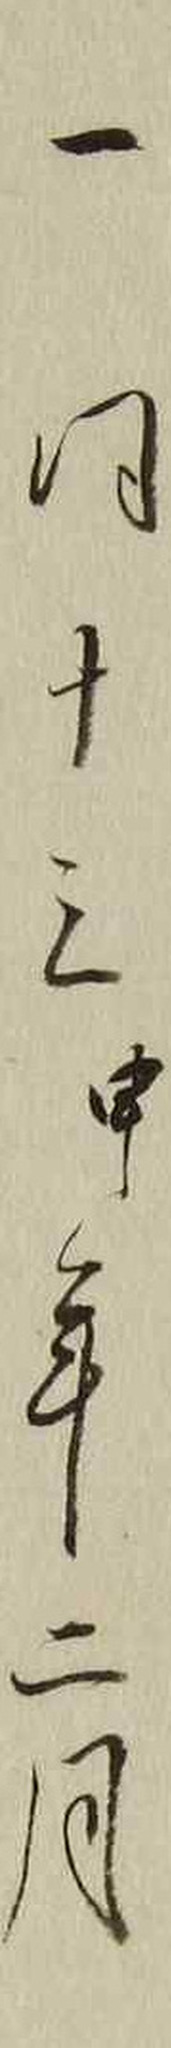一同十三申年二月
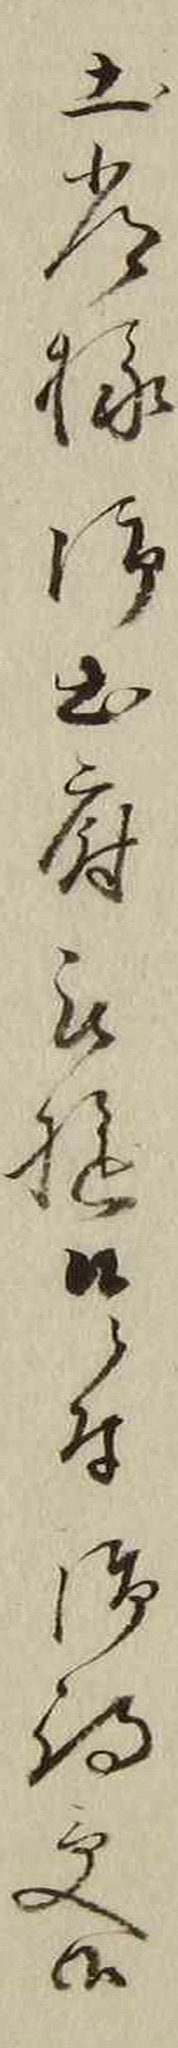土常様御出府被遊候ニ付御役受御
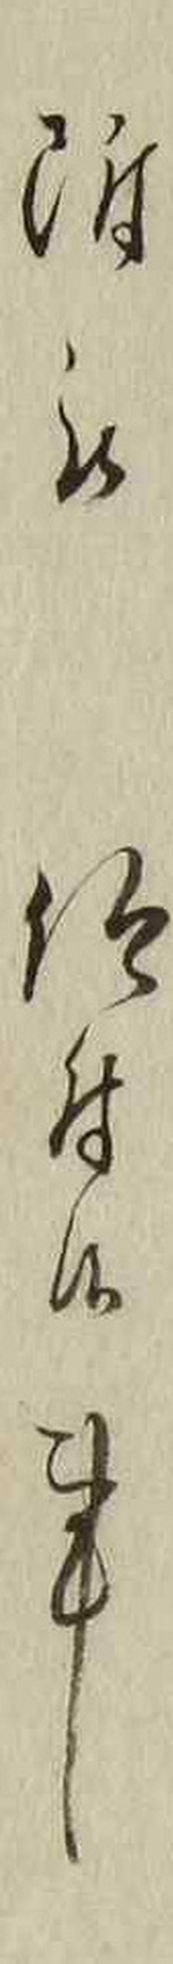附被仰付候事
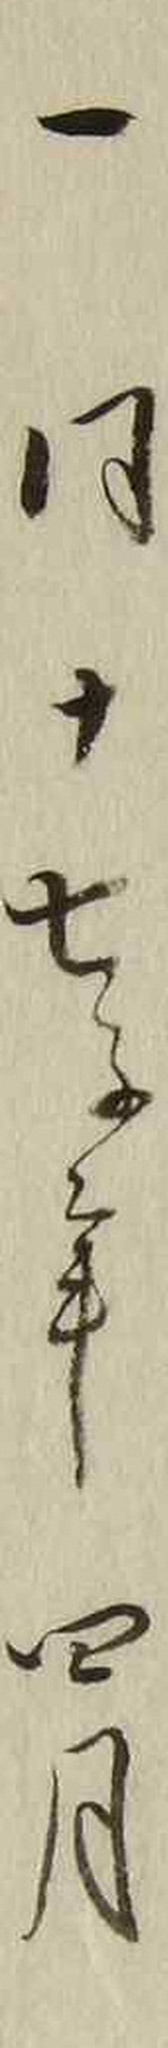一同十七子年四月
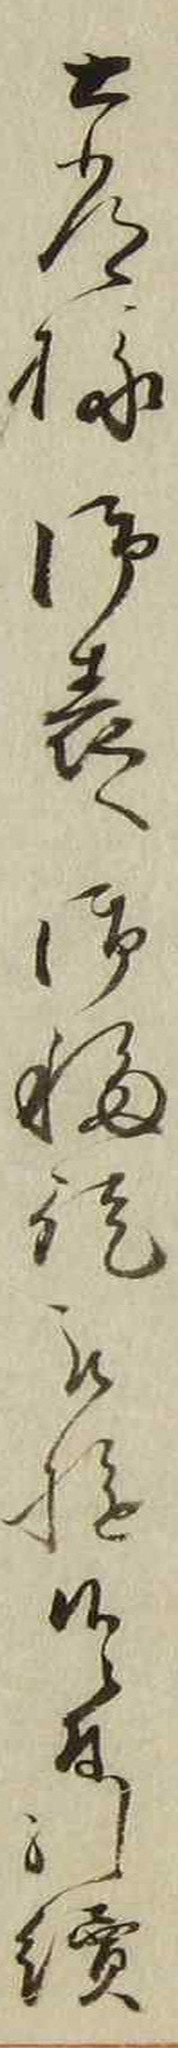土常様御表へ御移徒被遊候ニ付引続
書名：諸士系譜　巻之32　い之部32
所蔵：会津若松市立会津図書館
